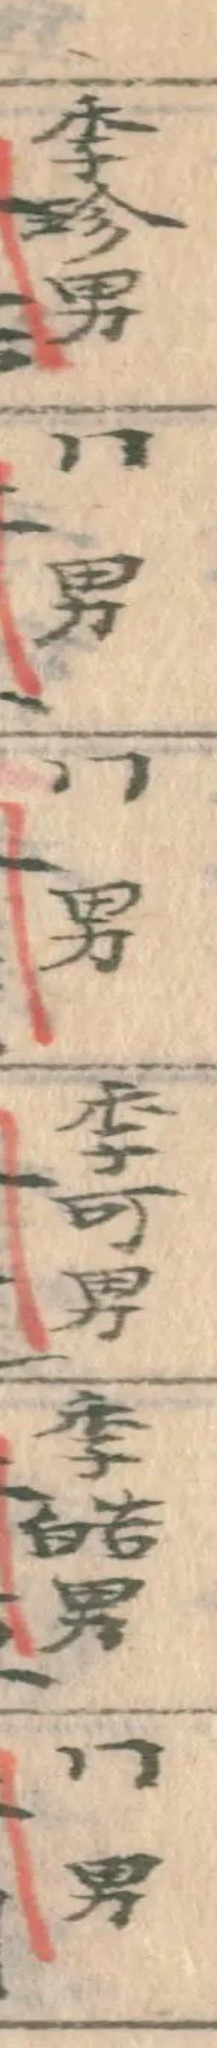季珍男同男同男季可男季皓男同男
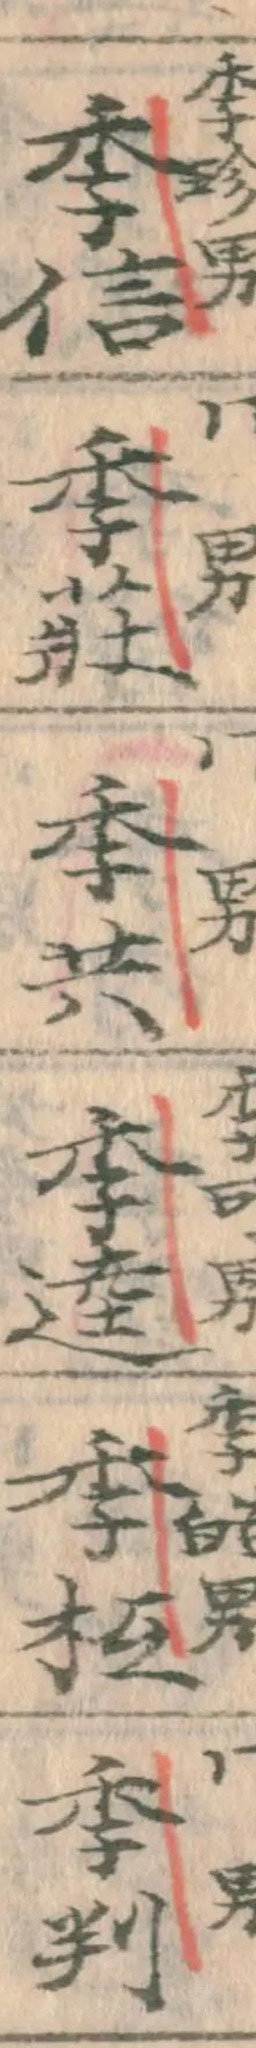季信季荘季共季達季桎季判
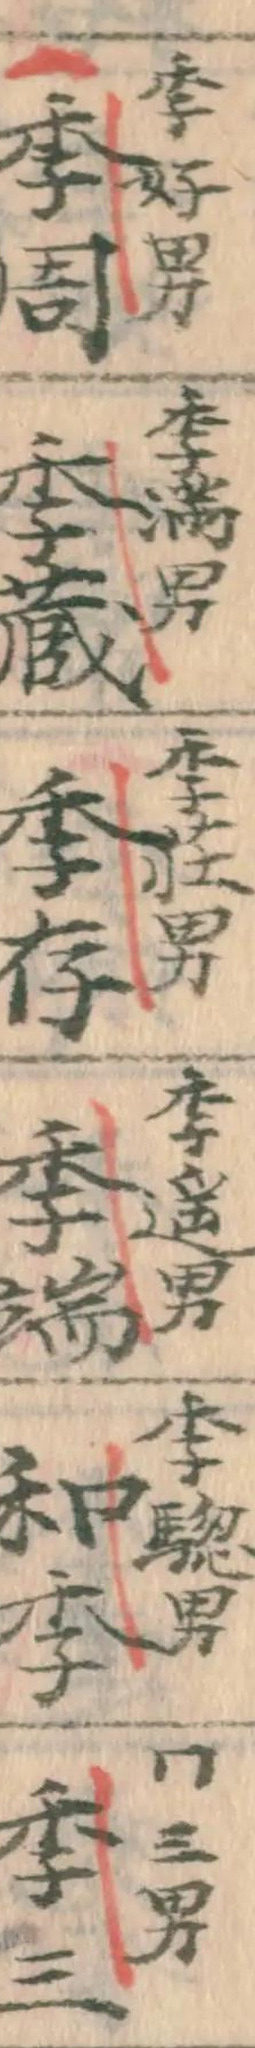▲季周季蔵季存季端和季季三
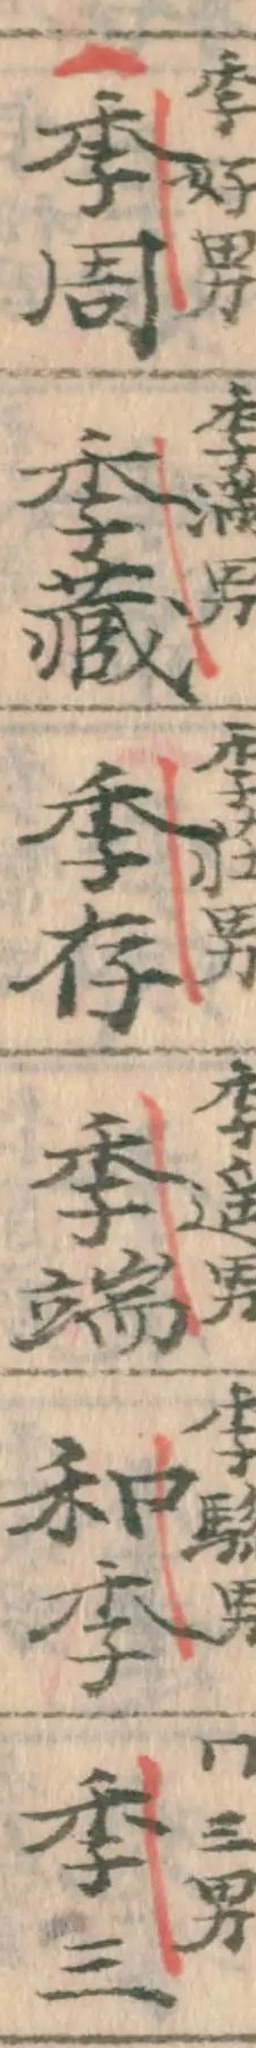▲季周季蔵季存季端和季季三
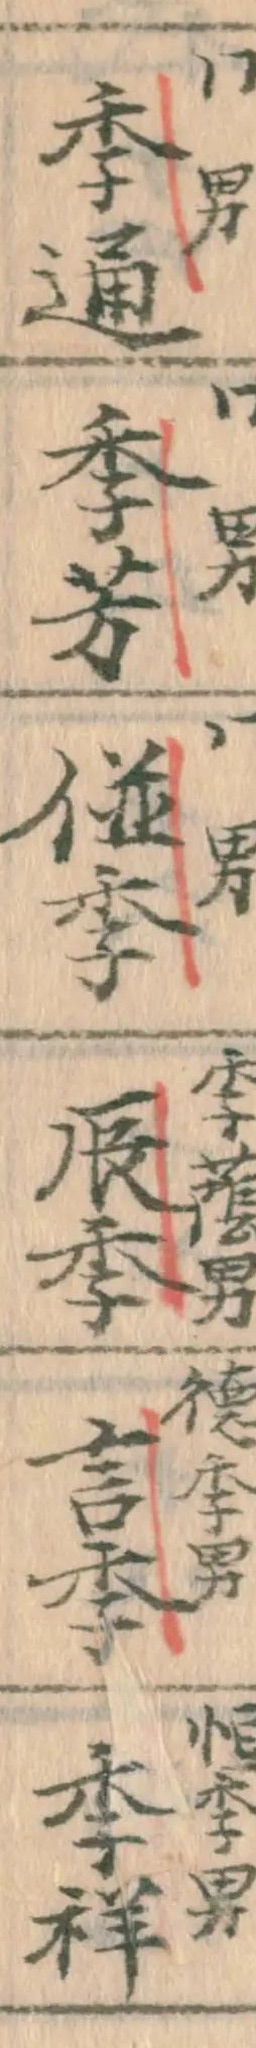季通季芳季辰季言季季祥
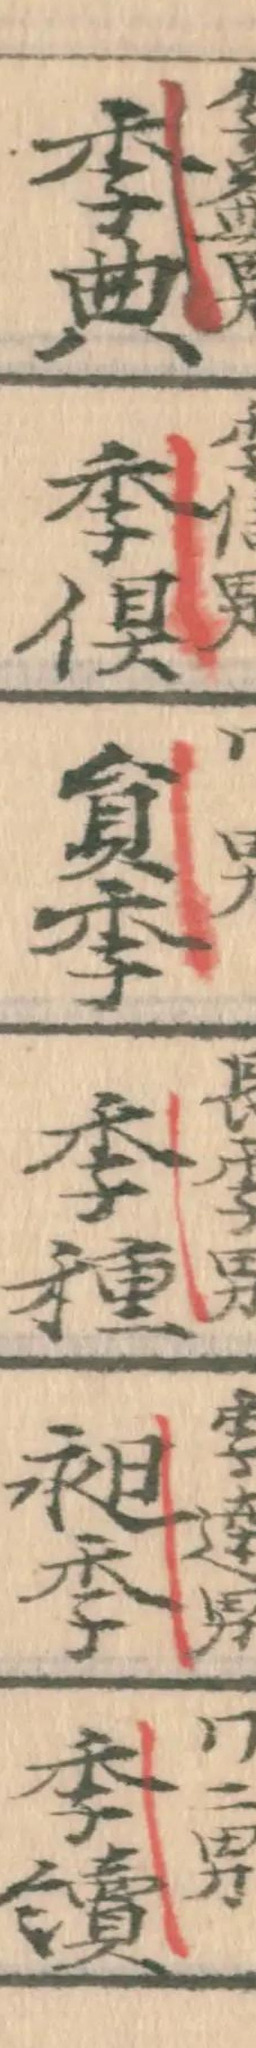季典季倶員季季種昶季季続
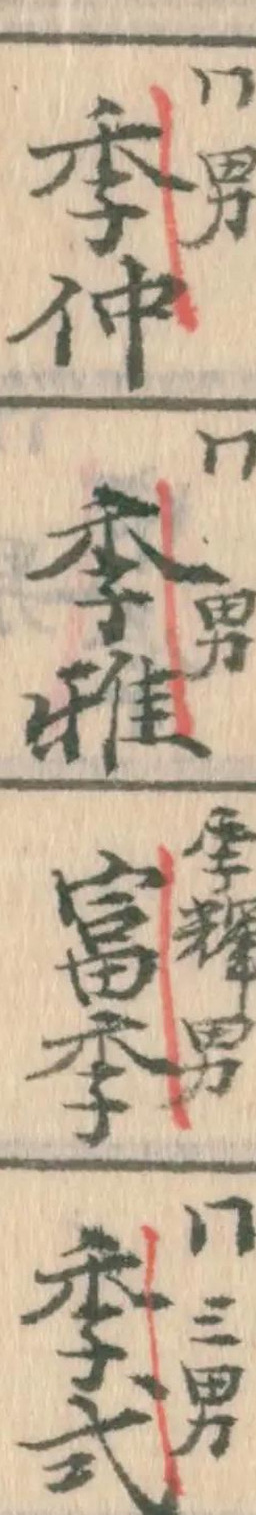季仲季雅富季季式

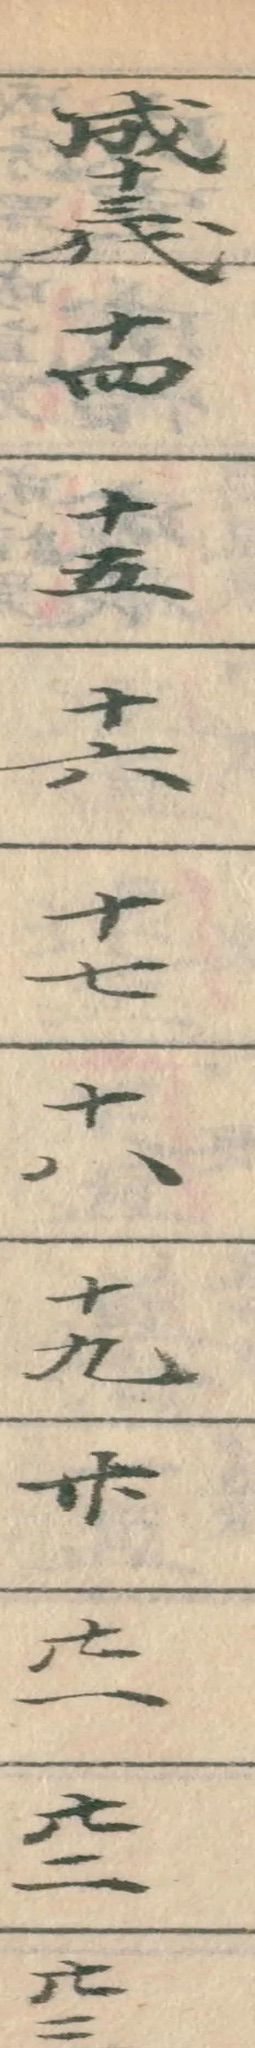成十三代十四十五十六十七十八十九廿廿一廿二廿三
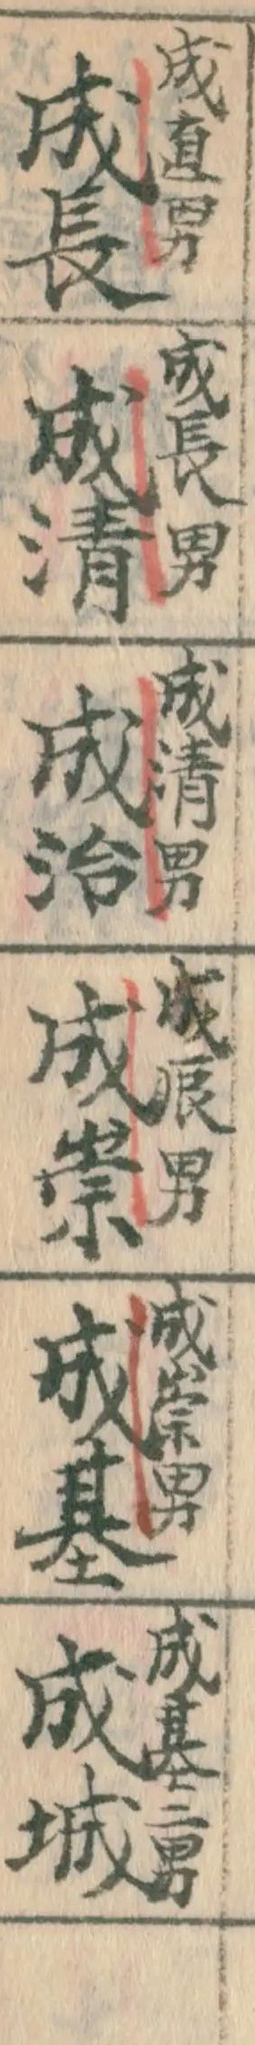成長成清成治成崇成基成城

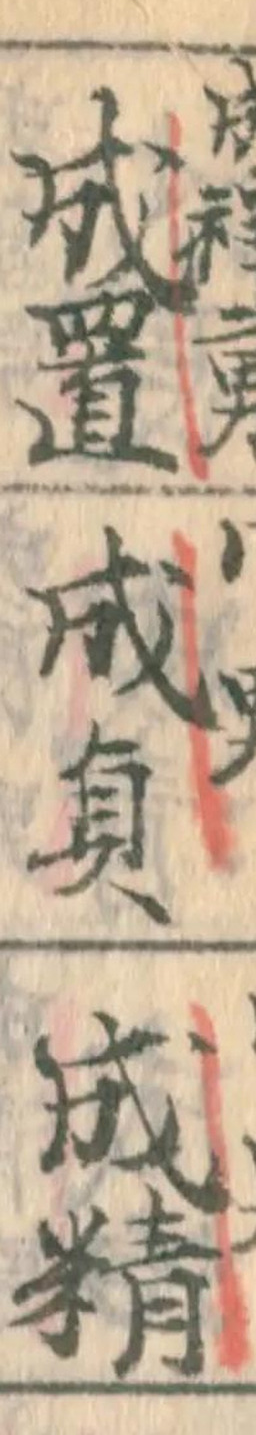成置成貞成精
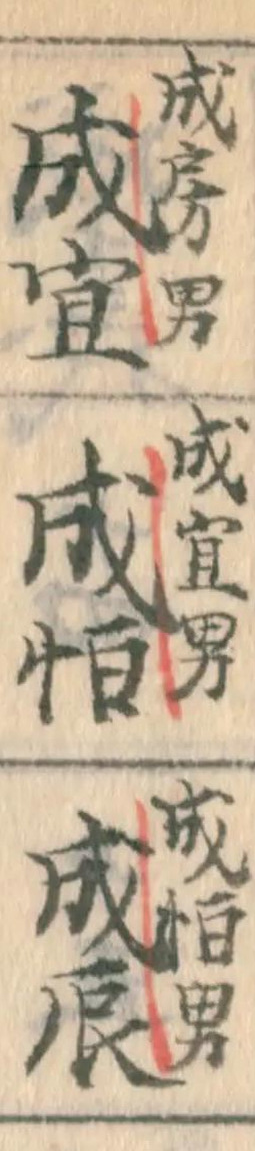成宜成怕成辰
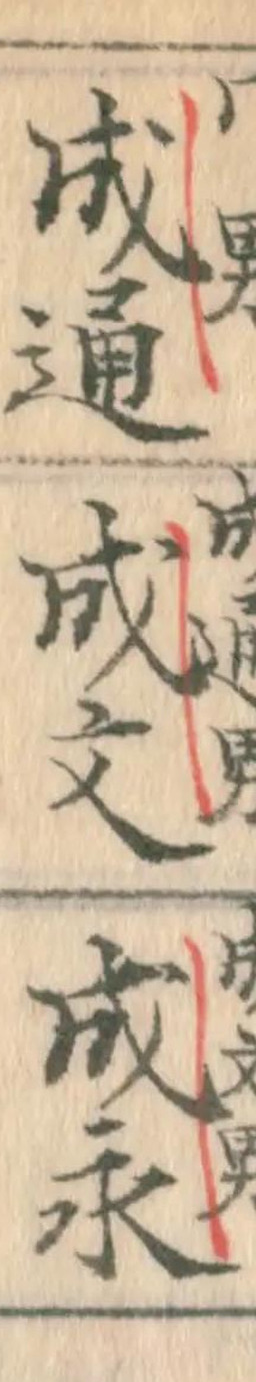成通成文成永
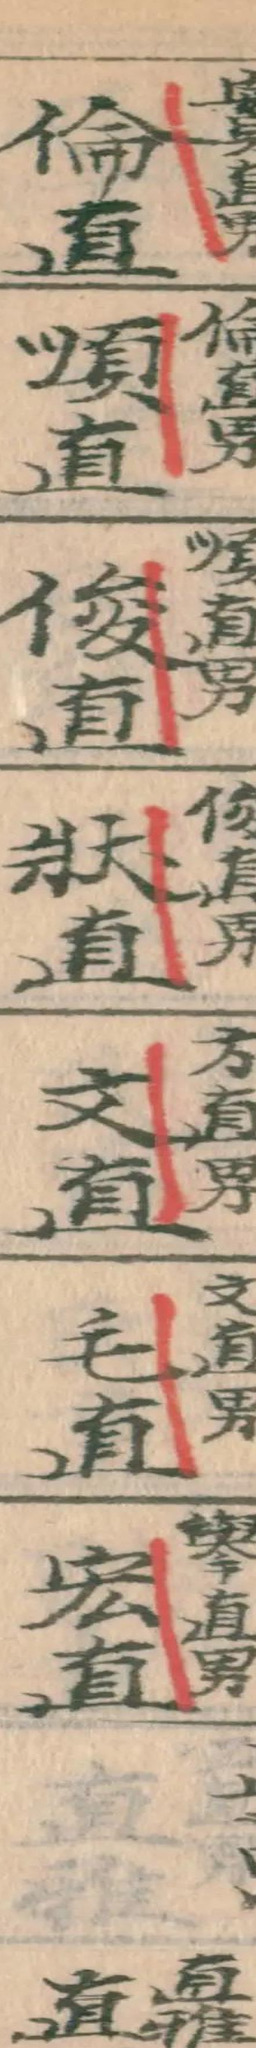倫直順直俊直状直文直毛直宏直直穏
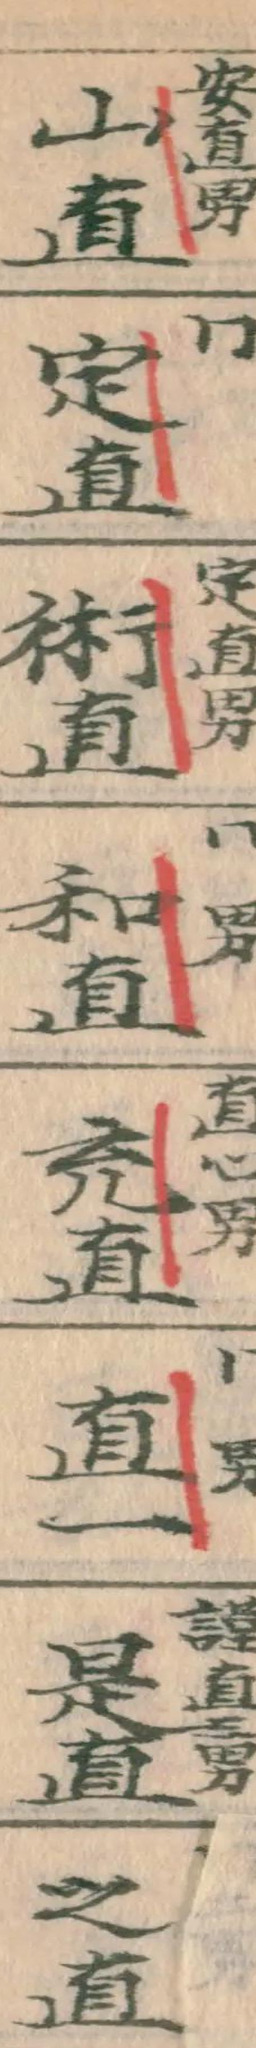山直定直術直和直充直直一是直之直
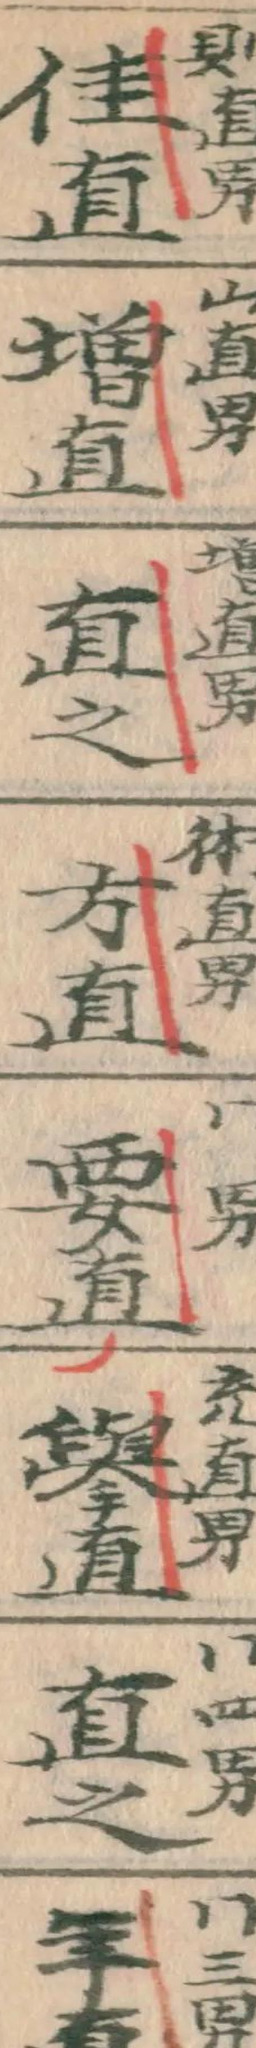佳直増直直之方直要直挙直直之年直
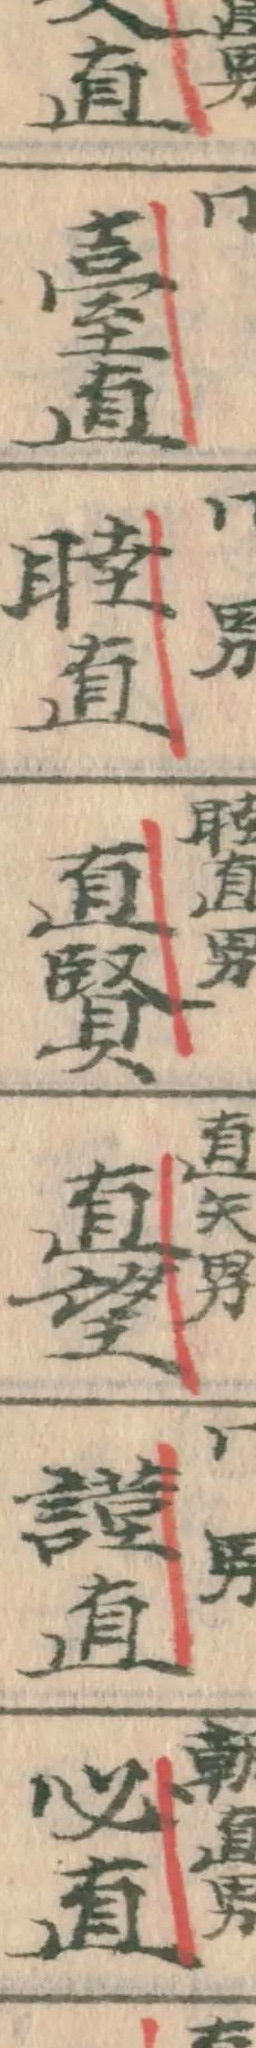友直台直睦直直賢直望謹直必直
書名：賀茂社記録. 第24冊
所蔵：国立国会図書館 National Diet Library, JAPAN
